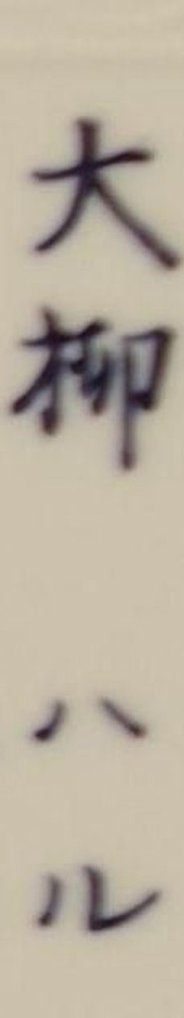大柳ハル
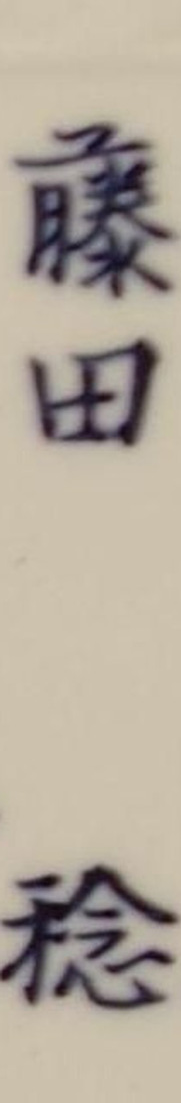藤田稔
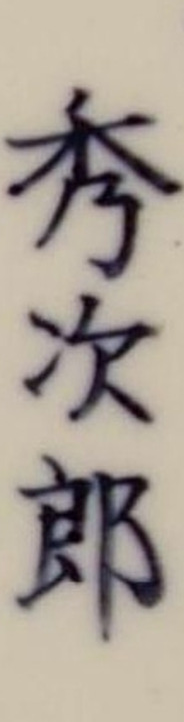秀次郎
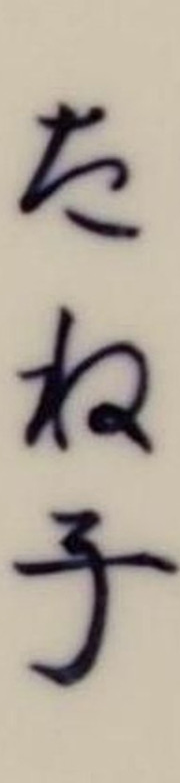たね子
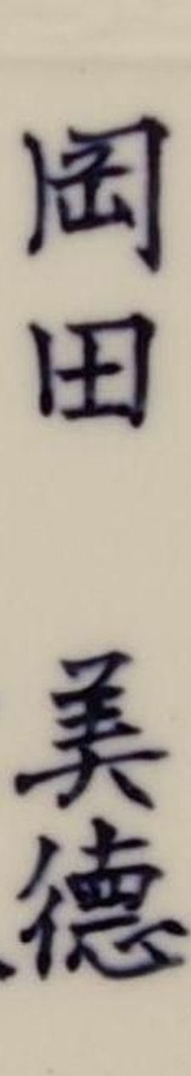岡田美徳
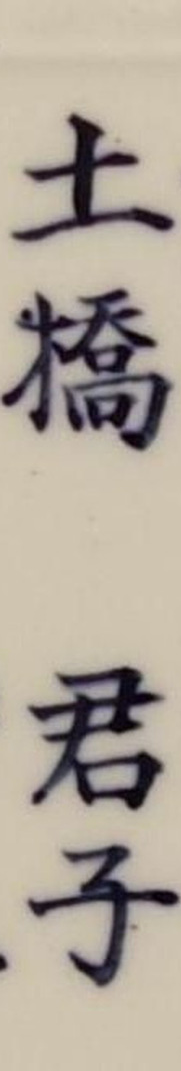土橋君子
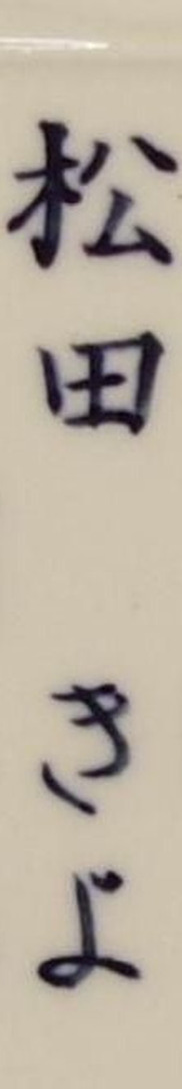松田きよ
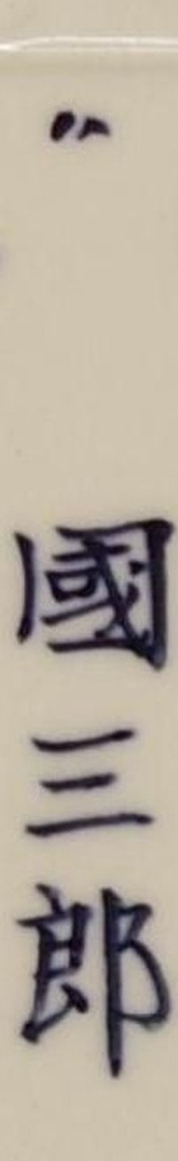國三郎
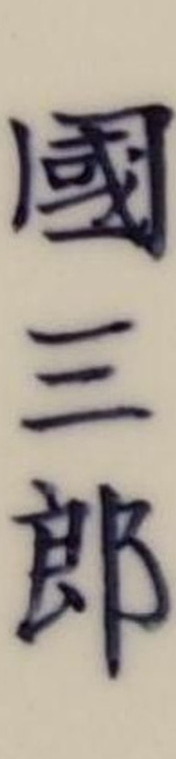國三郎
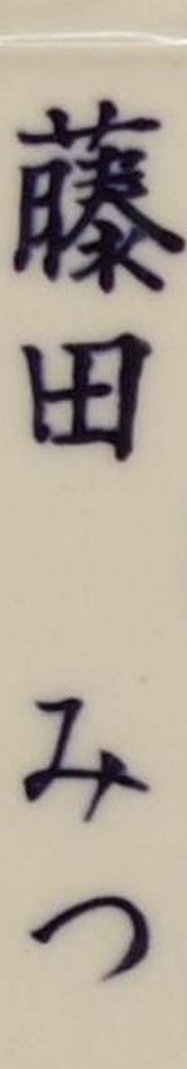藤田みつ
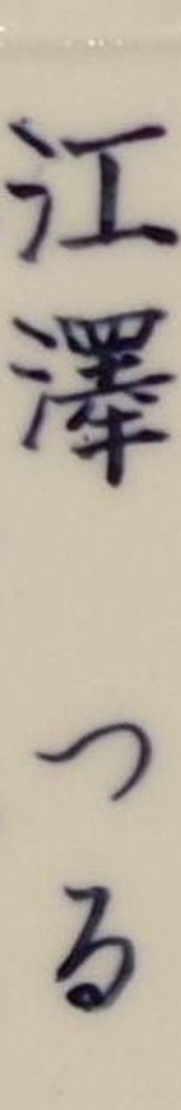江澤つる
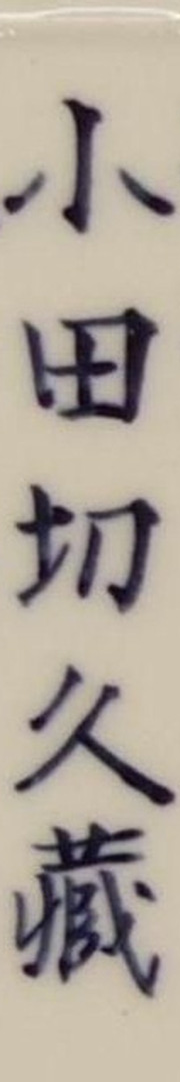小田切久蔵
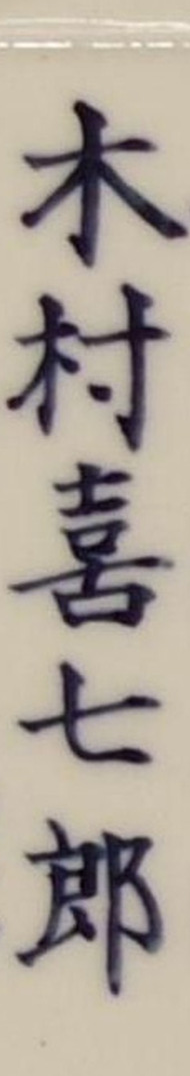木村喜七郎
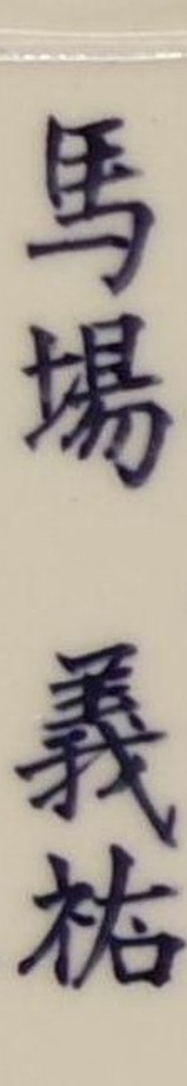馬場義祐
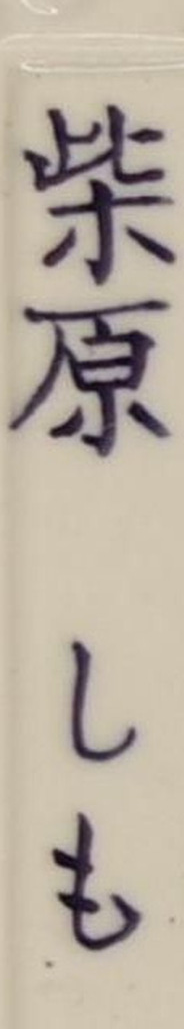柴原しも

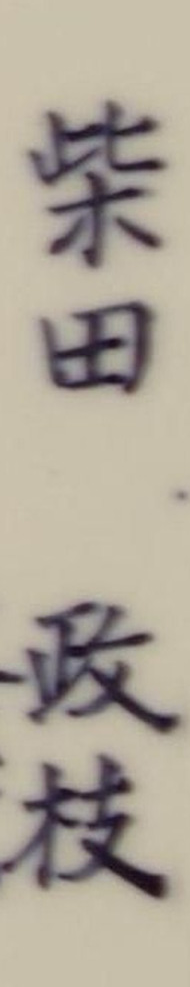柴田政枝
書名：M~S
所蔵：高野山金剛峯寺
